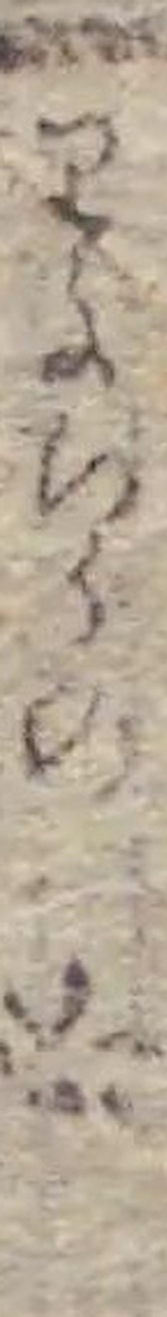りよちうの
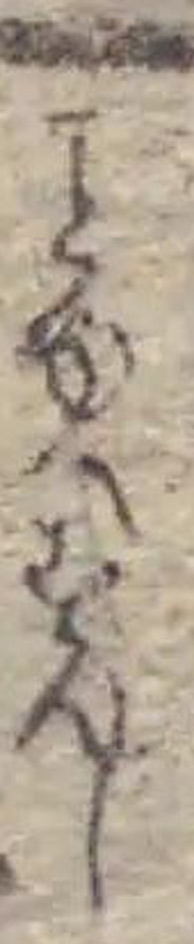ことゆへすんし
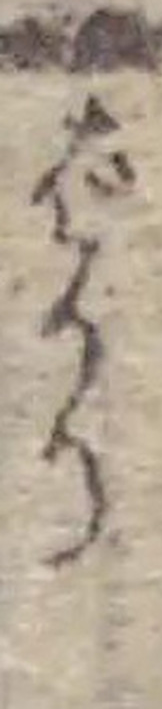ばかり
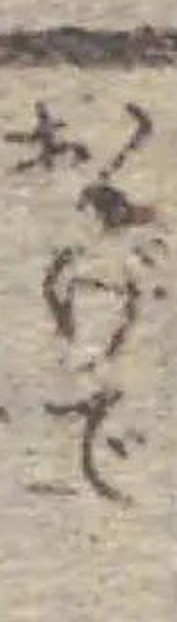おかげで
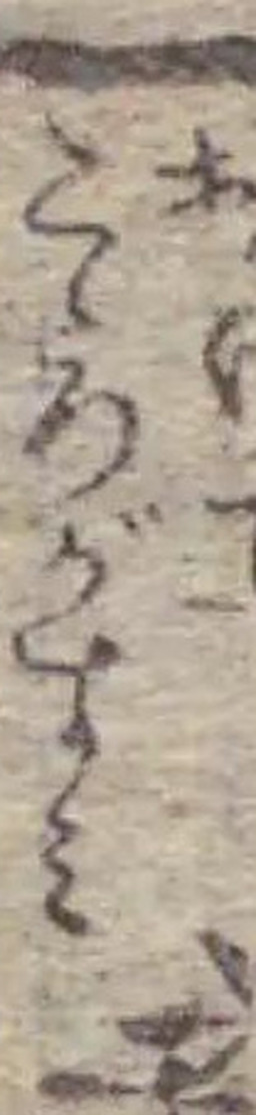こゝろがすみ
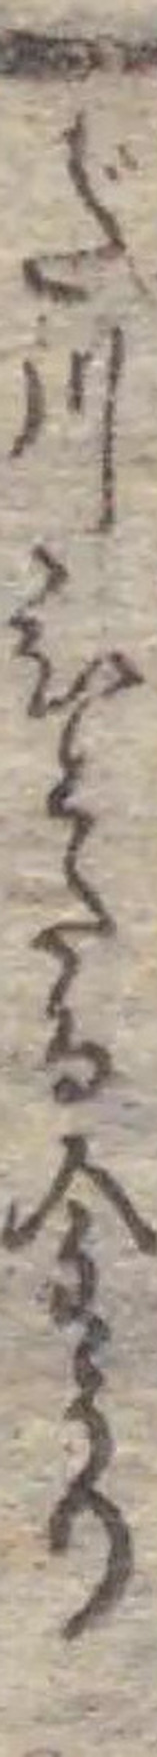だ川ひとたる金うり
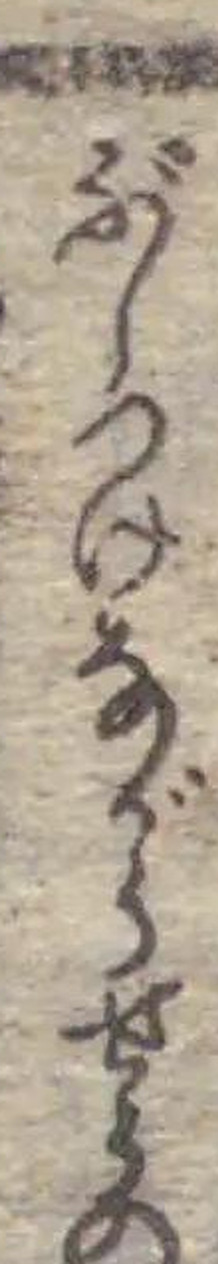ぶしつけながらせうの
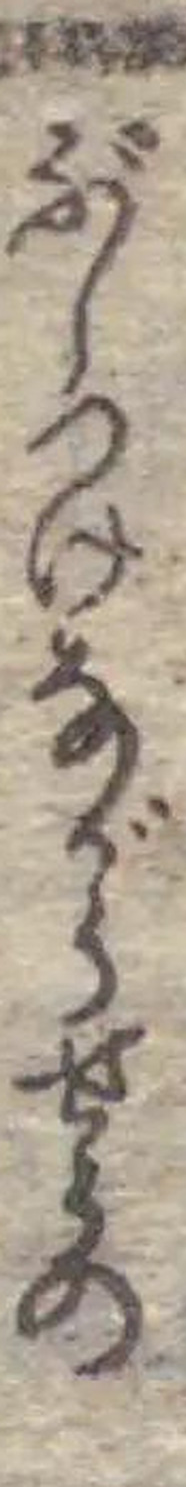ぶしつけながらせうの
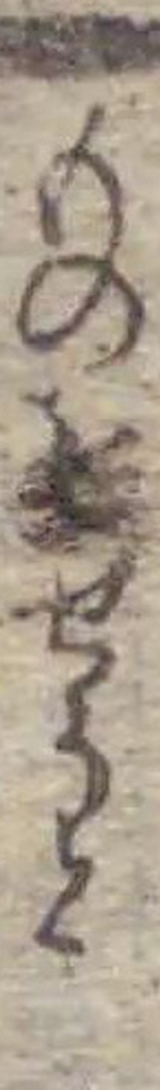ものをせうと
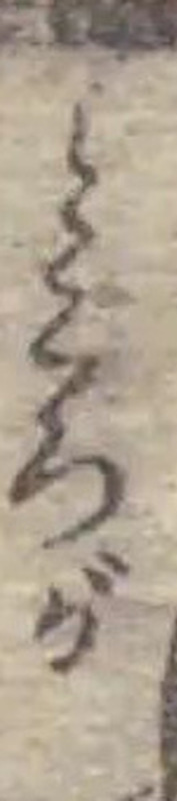ところが
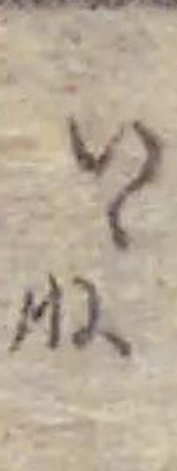いゝね

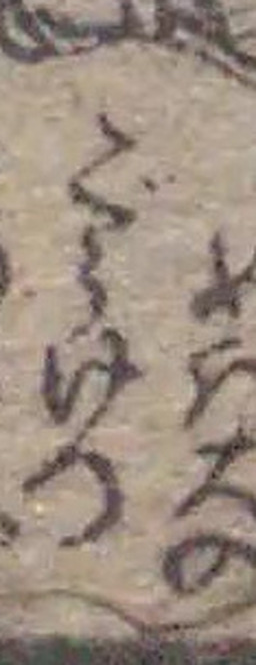ごうけつ
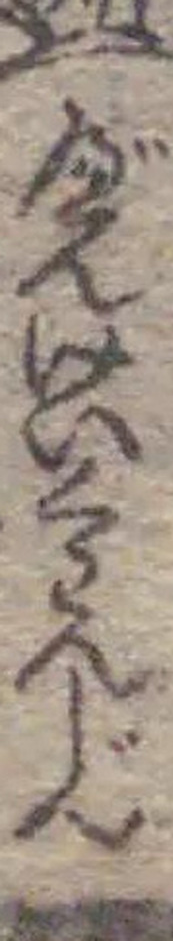べんけいくわんじん
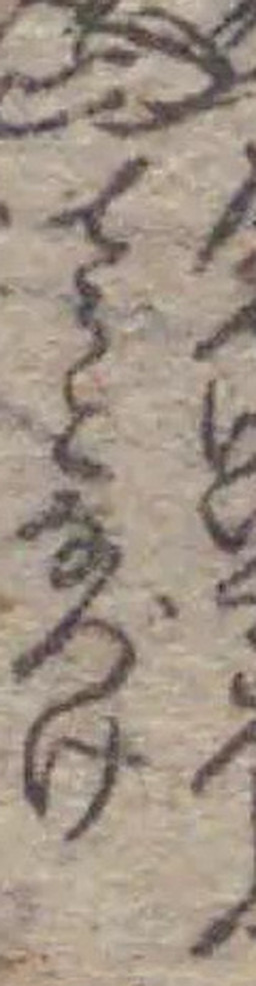てうとなづけ
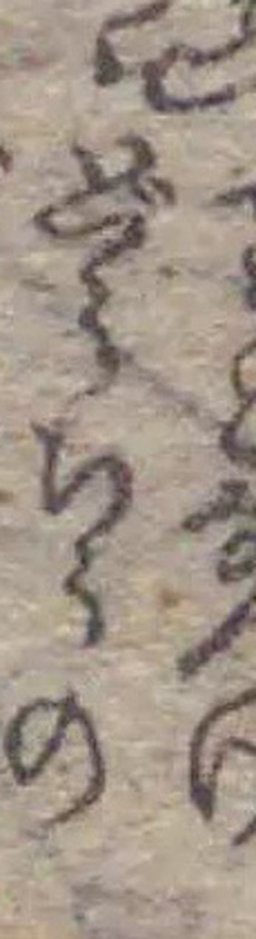どうちうの
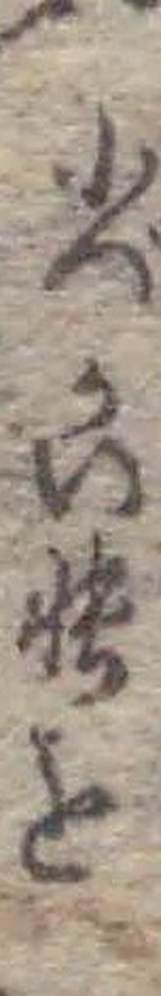小づかい帳を
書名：通増安宅関 2巻
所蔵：国立国会図書館 National Diet Library, JAPAN
